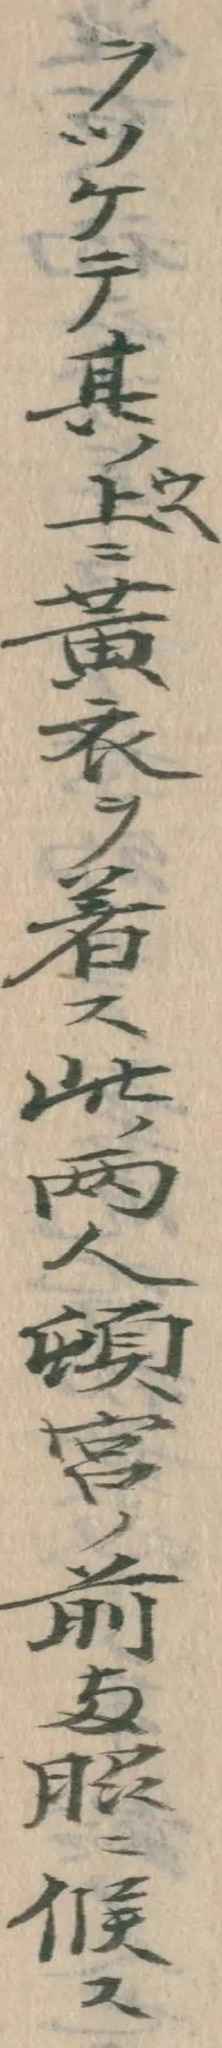ヲツケテ其ノ上ニ黄衣ヲ着ス此ノ両人頓宮ノ前両脇ニ候ス
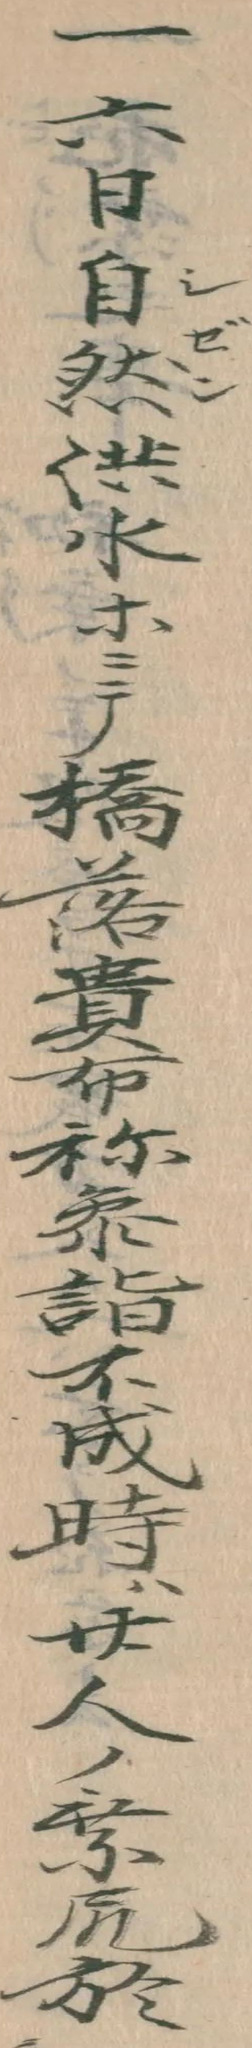一六日自然洪水等ニテ橋落貴布禰参詣不成時ハ廿人ノ乗尻於
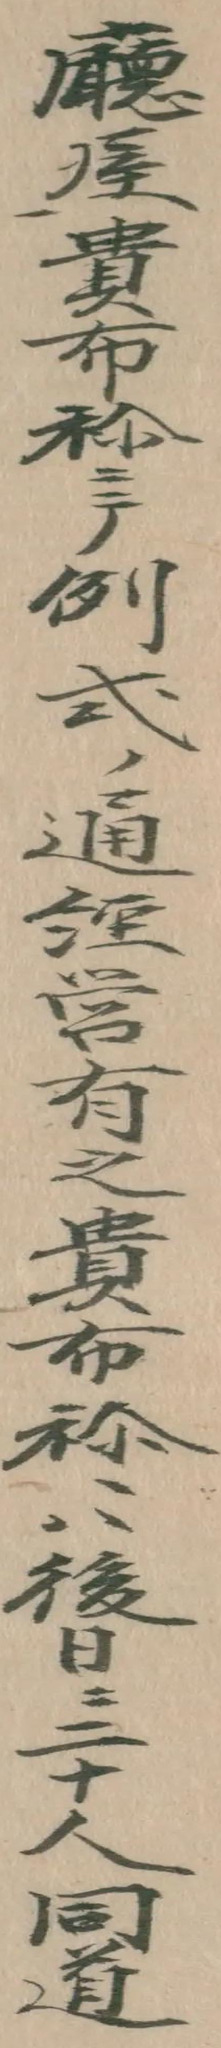庁屋貴布禰ニテ例式ノ通経営有之貴布禰ヘハ後日ニ二十人同道
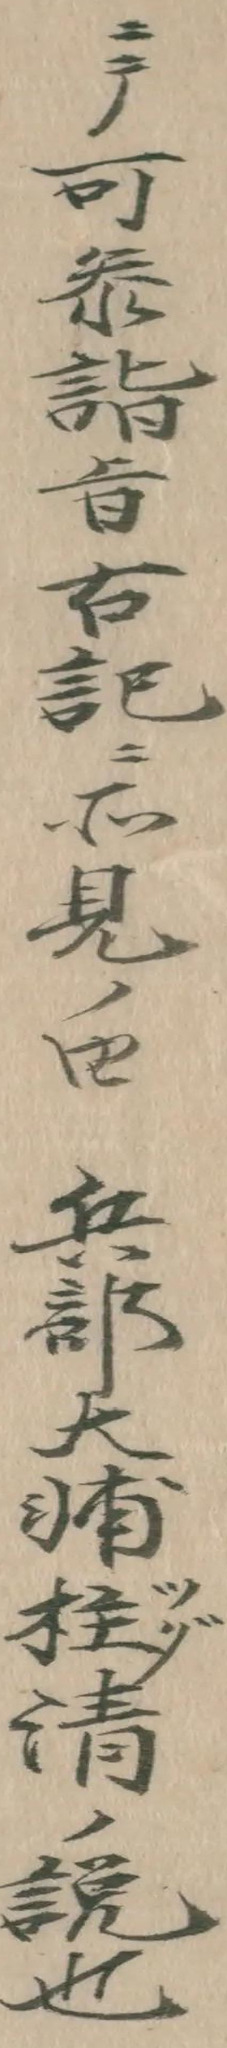ニテ可参詣旨古記ニ所見ノ由兵部大輔柱清ノ説也
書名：賀茂社記録. 第11冊
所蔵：国立国会図書館 National Diet Library, JAPAN
